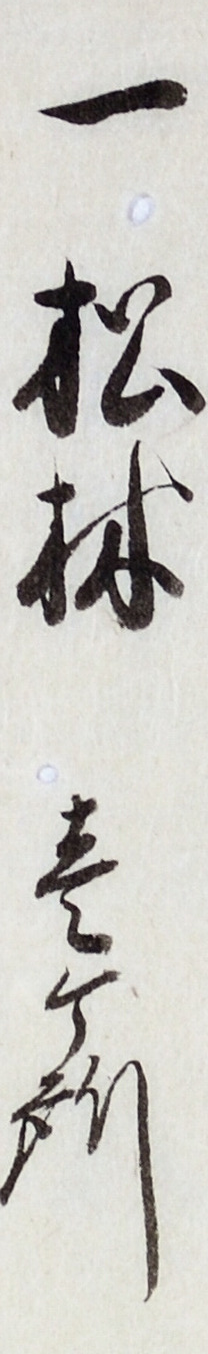一松林壱ケ所
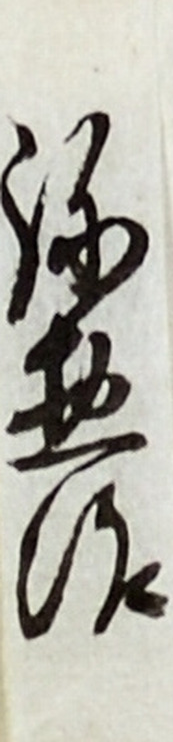弥惣治

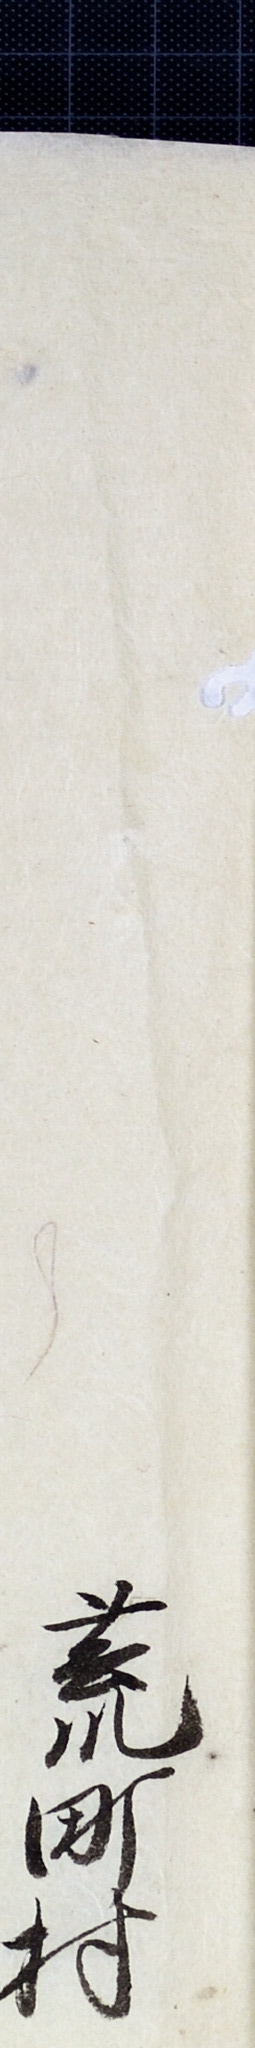荒町村
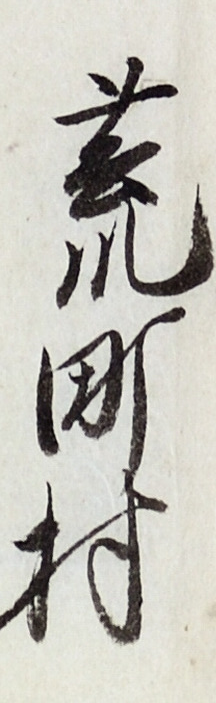荒町村
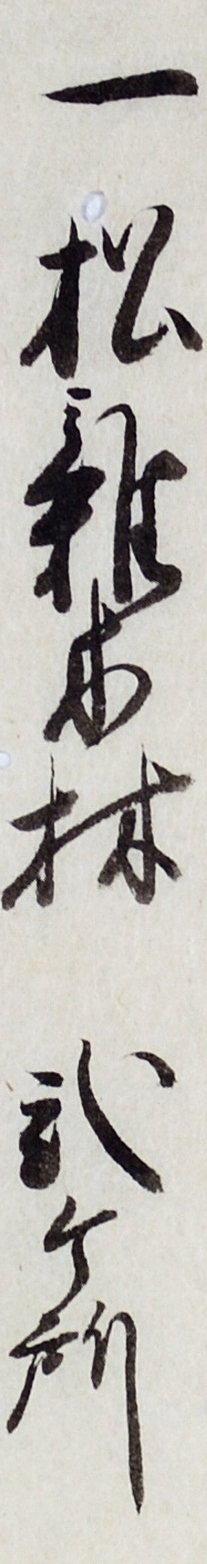一松雑木林弐ケ所
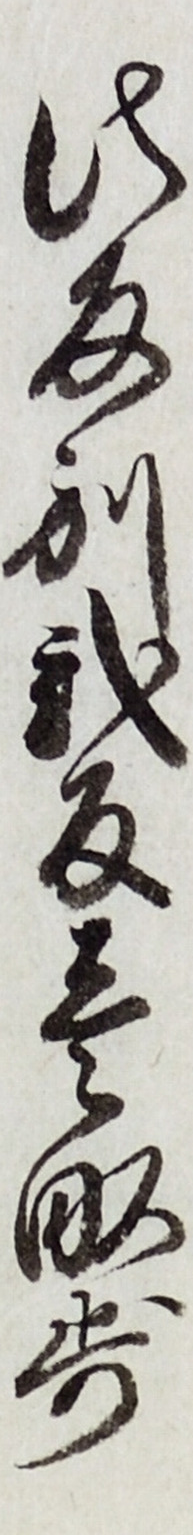此反別弐反壱畝歩
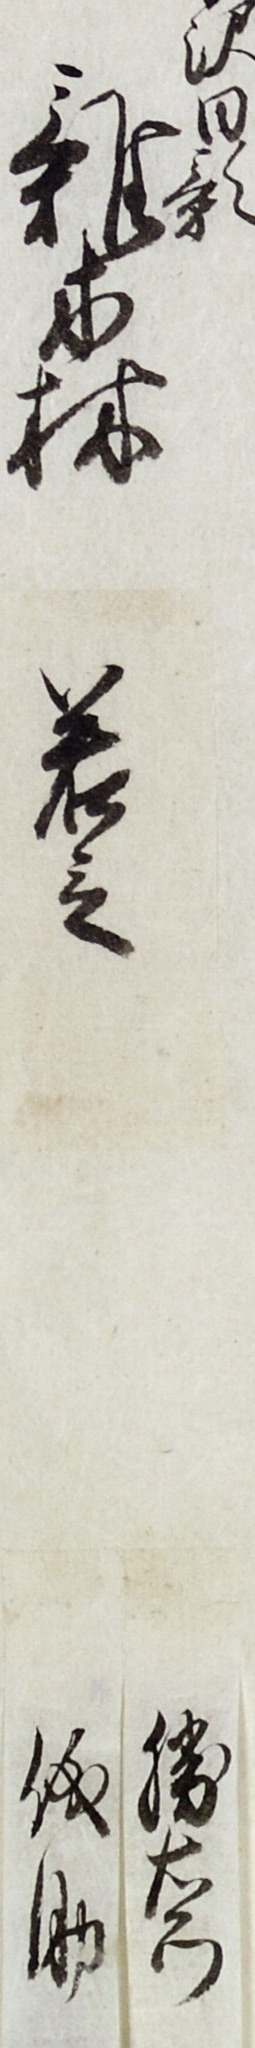雑木林若立儀助
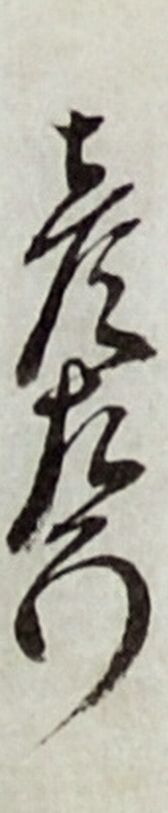彦左衛門

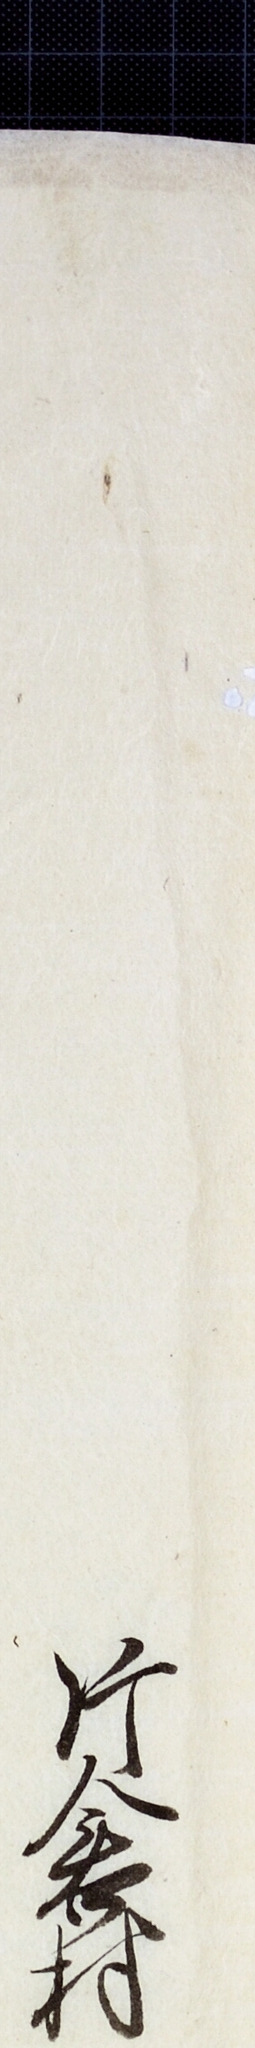片倉村
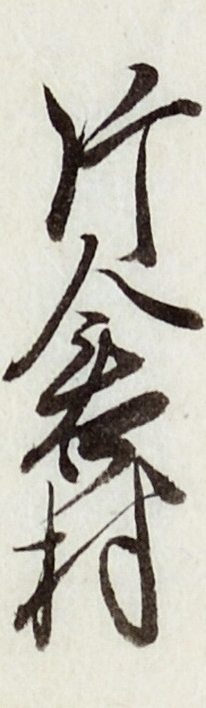片倉村
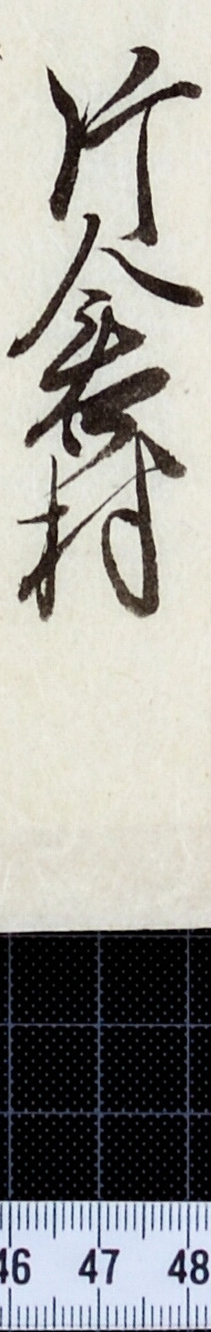片倉村
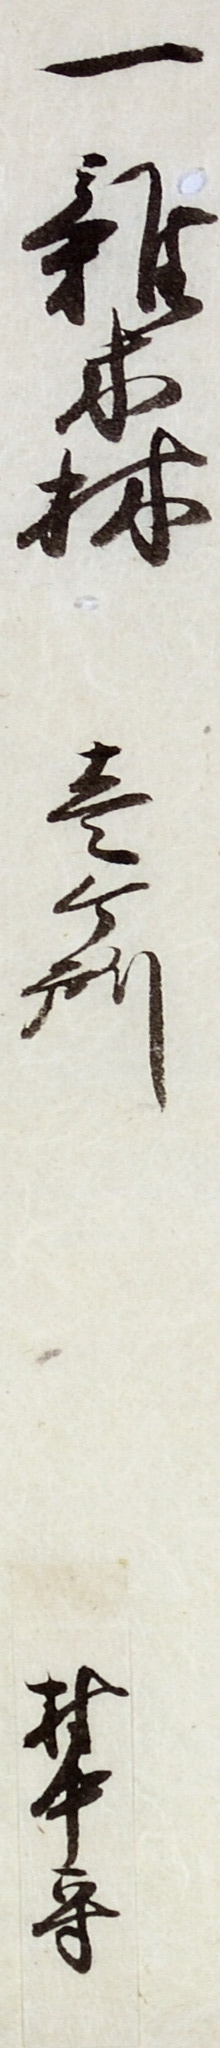一雑木林壱ケ所村中守
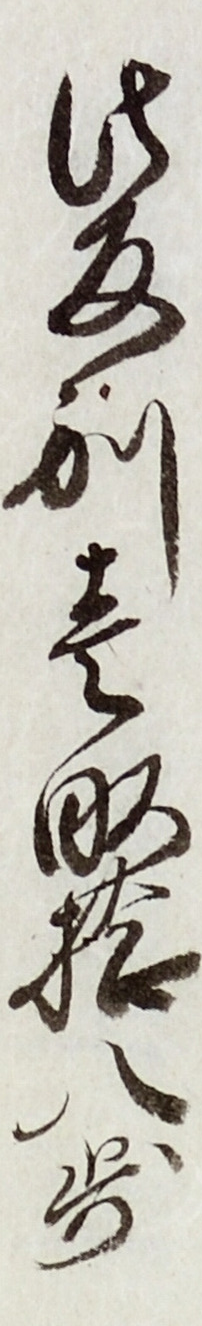此反別壱畝拾八歩

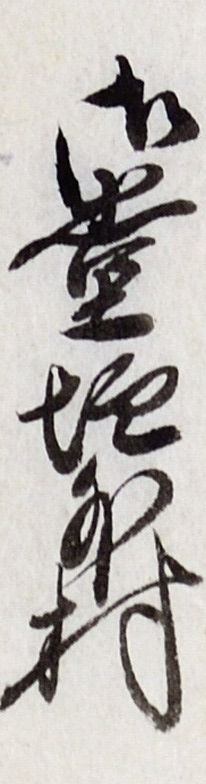御堂垣外村
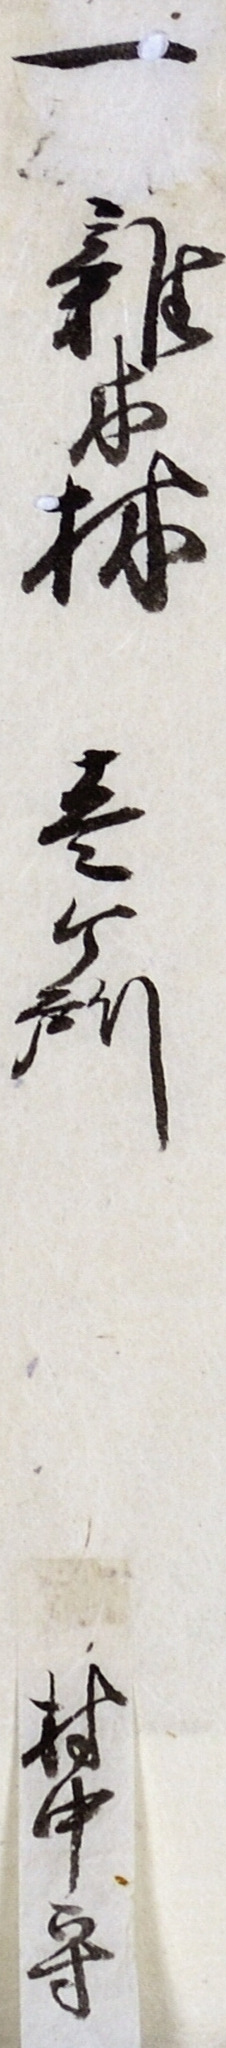一雑木林壱ケ所村中守
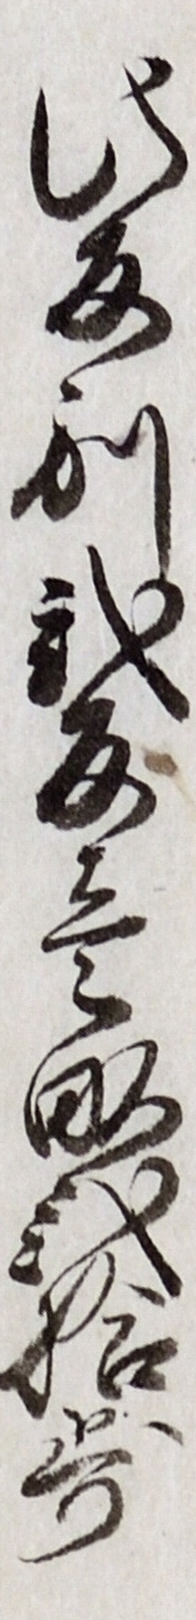此反別弐反壱畝弐拾歩
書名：御領分中御林御藪附帳
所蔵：伊那市立高遠町図書館・合同会社AMANE
